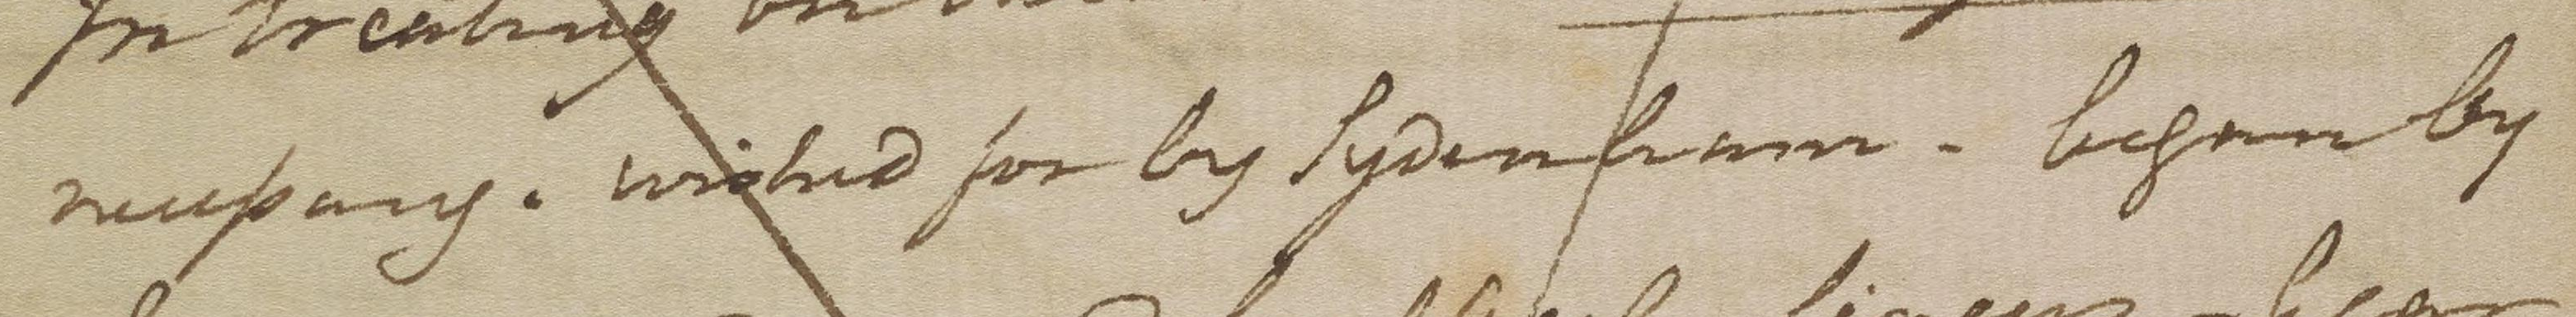necessary. wished for by Sydenham. began by
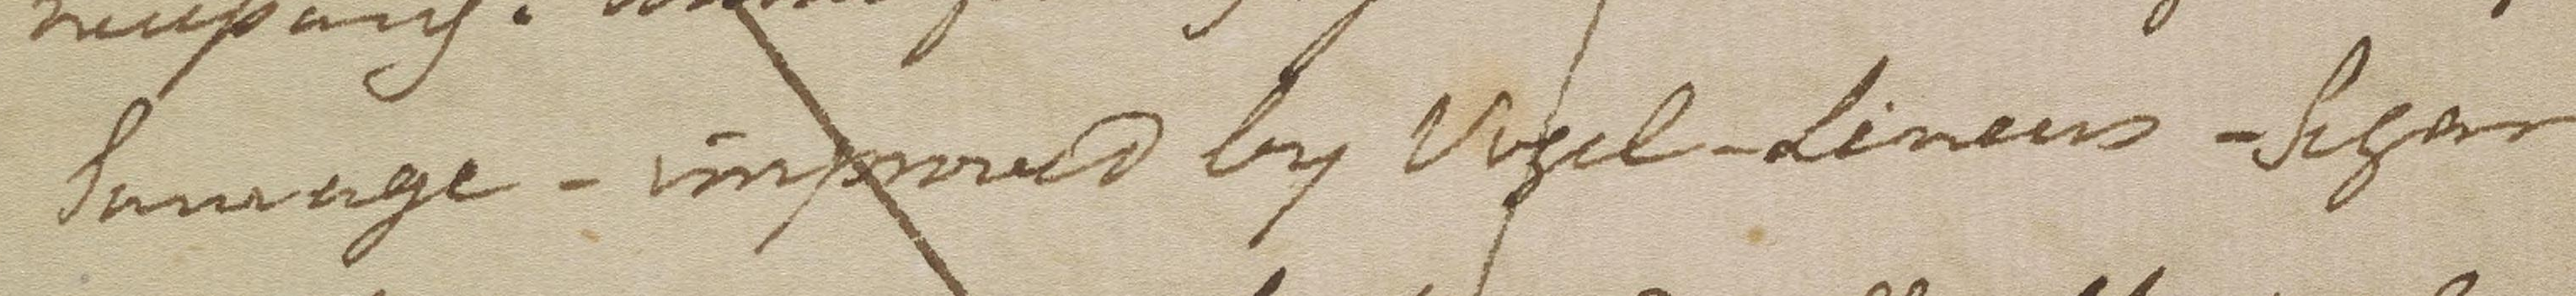Sauvage- improved by Vogel- Lineus- Suzarr
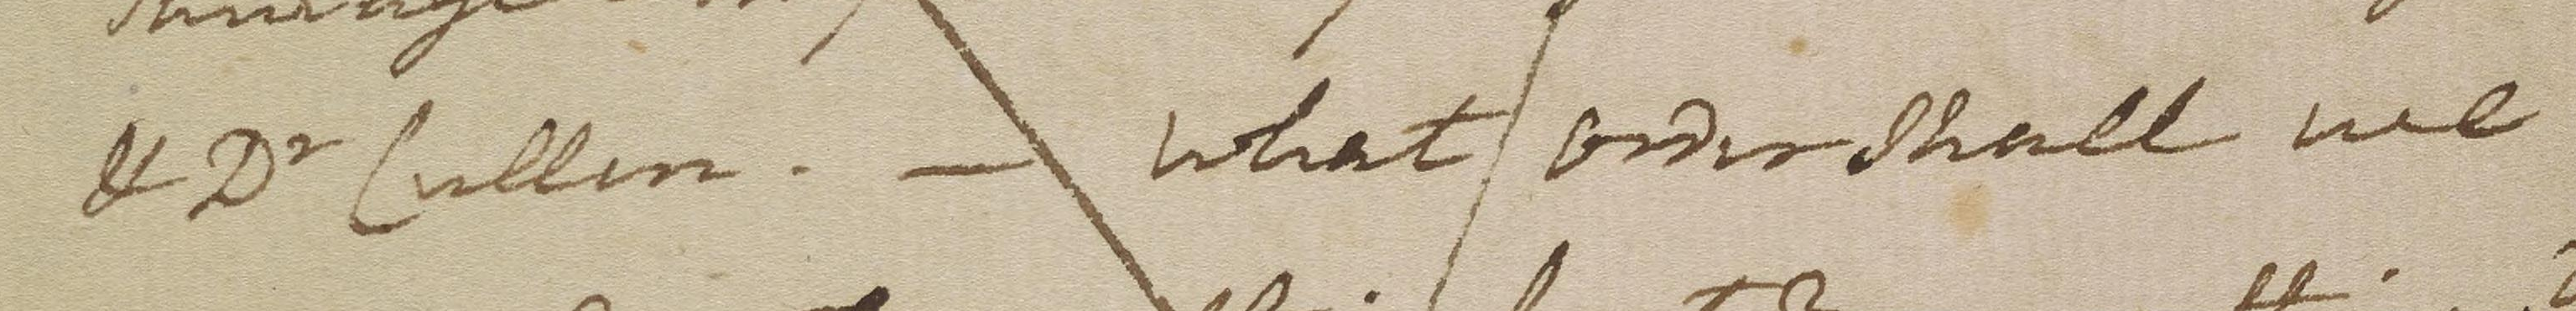& D^r Cullen.- What order shall we
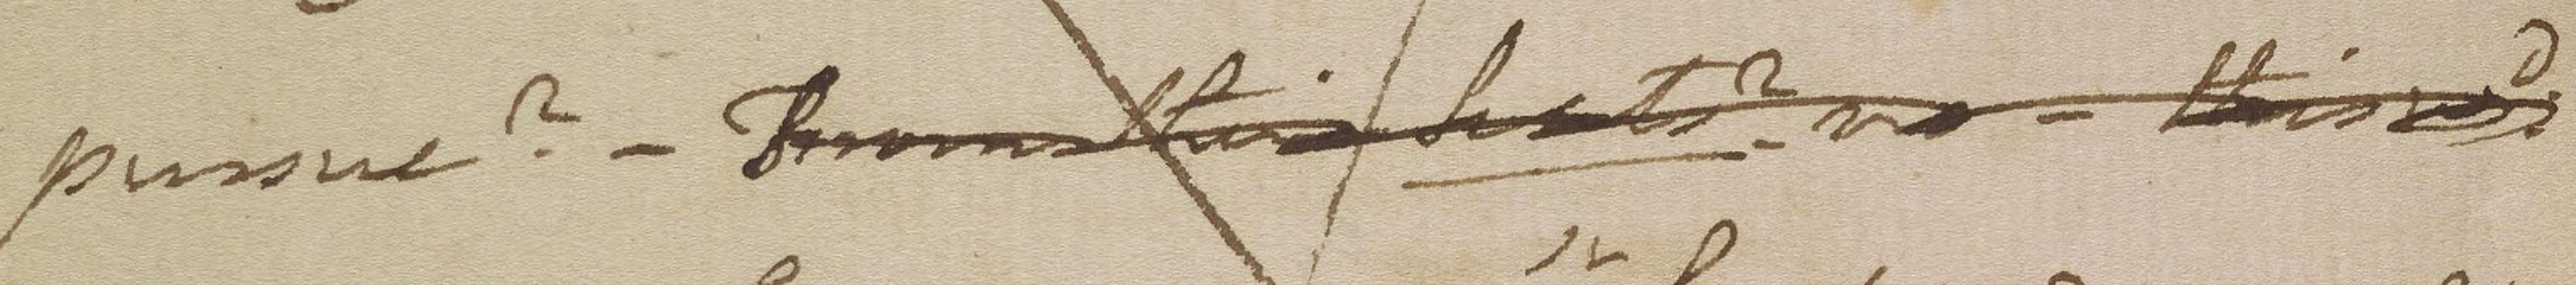pursue?- [__________________________]
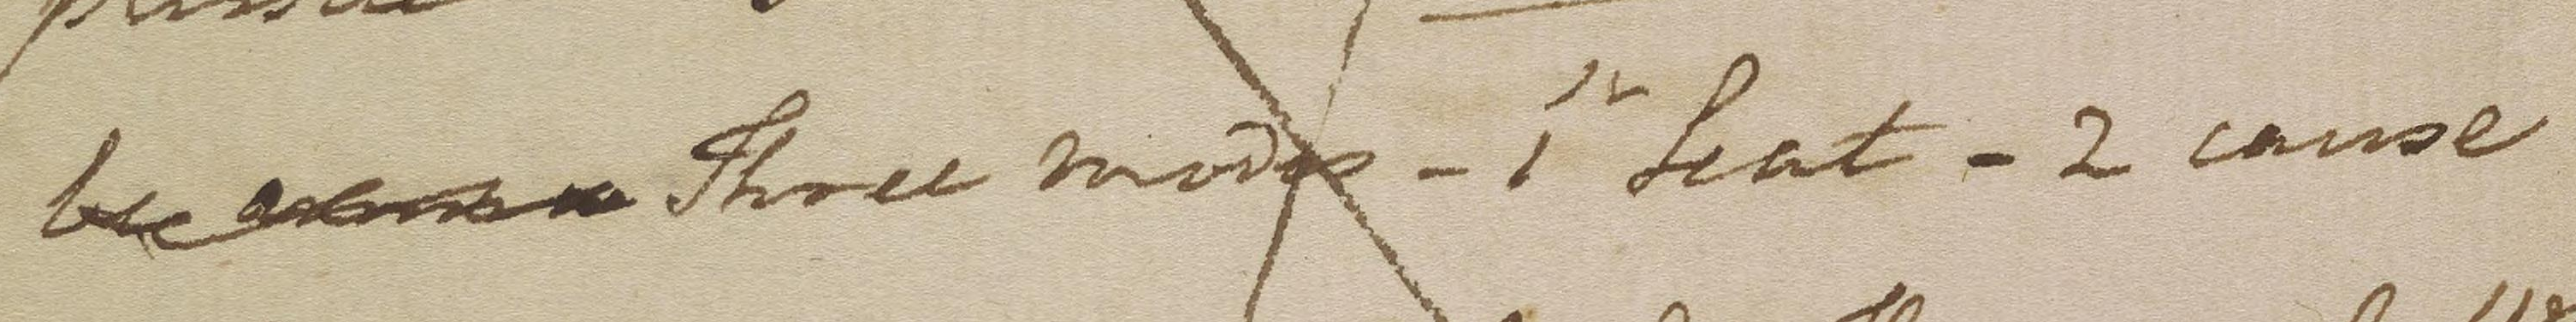[_______] Three modes- 1^st Seat- 2 cause
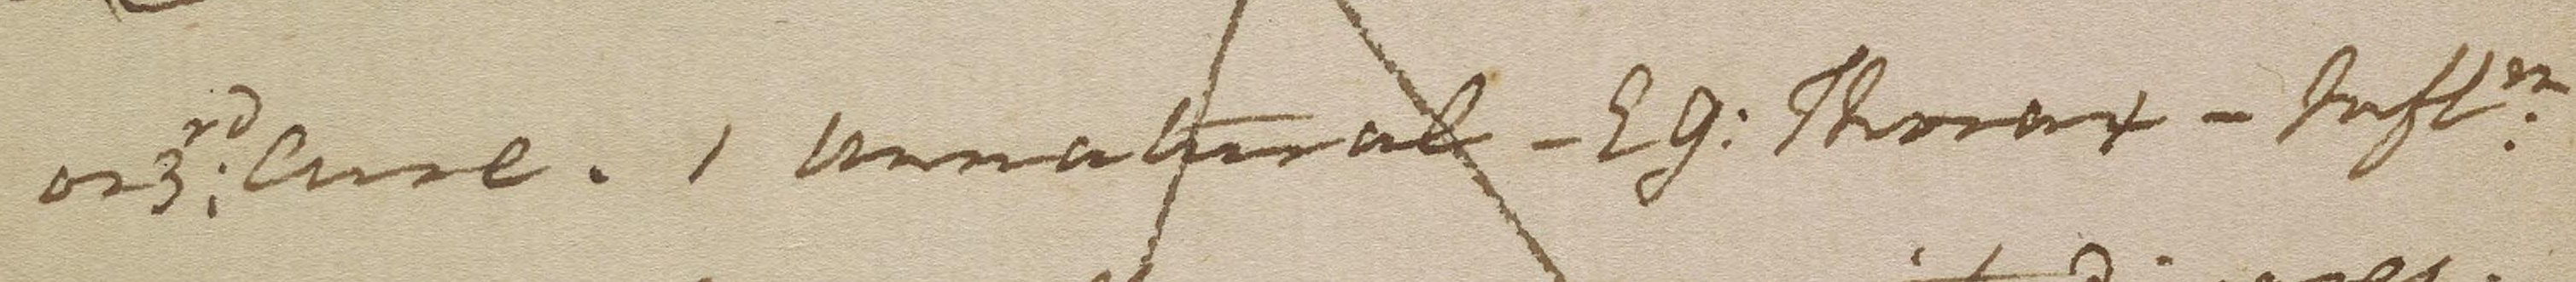or 3^rd: cure. 1 unnatural- Eg: Thorax- Infl^r:
